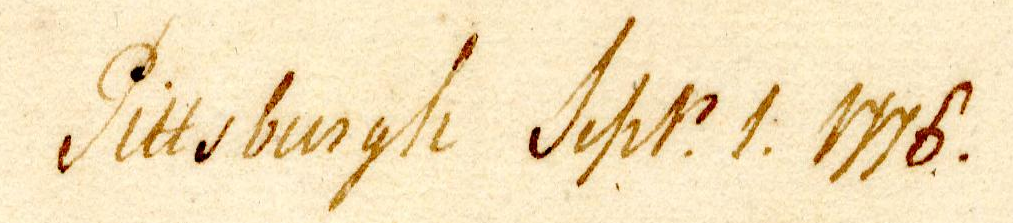Pittsburgh Sept^r. 1. 1776.
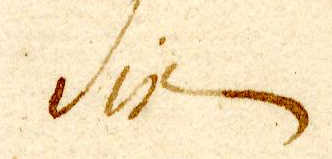Sir
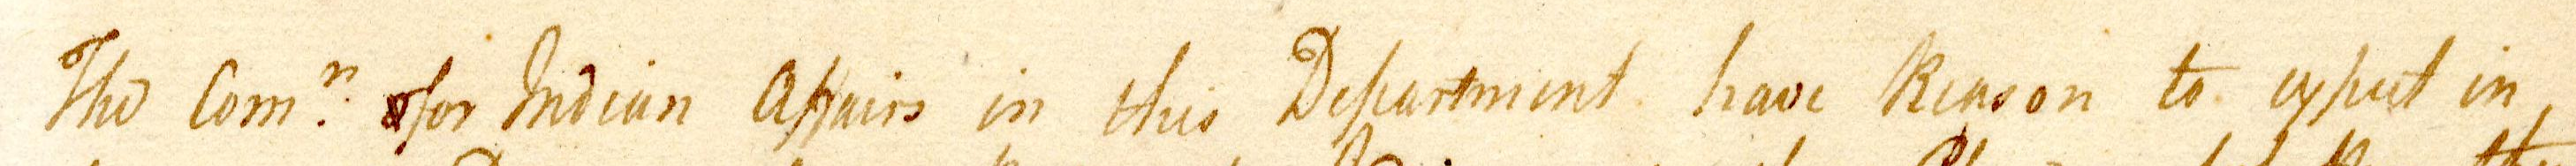The Com^r. for Indian Affairs in this Department have Reason to expect in
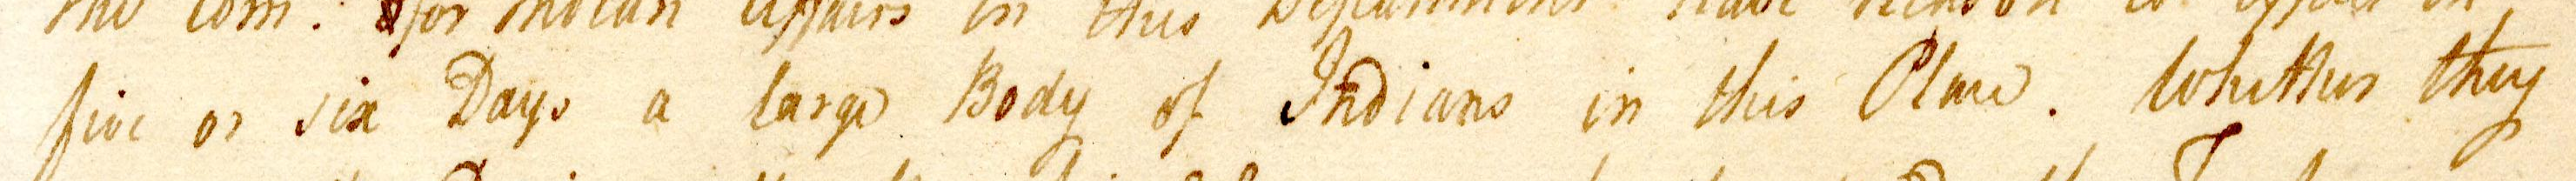five or six Days a large Body of Indians in this Place. Whether they
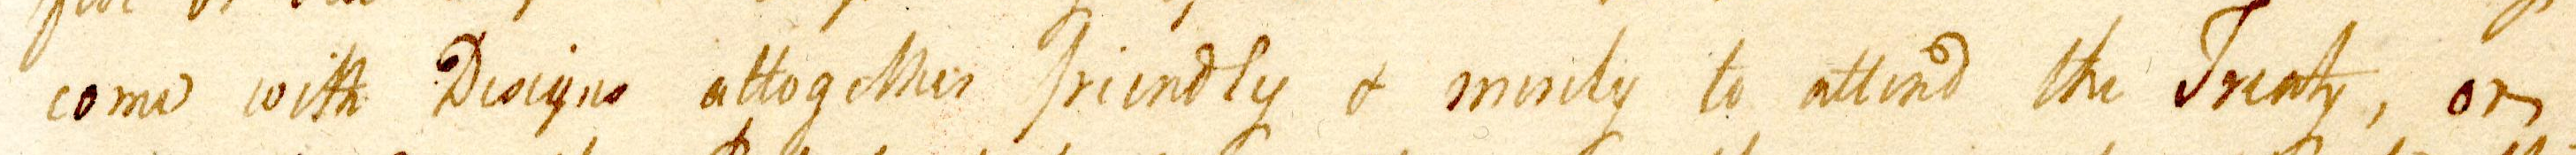come with Designs altogether friendly & merily to attend the Treaty, or
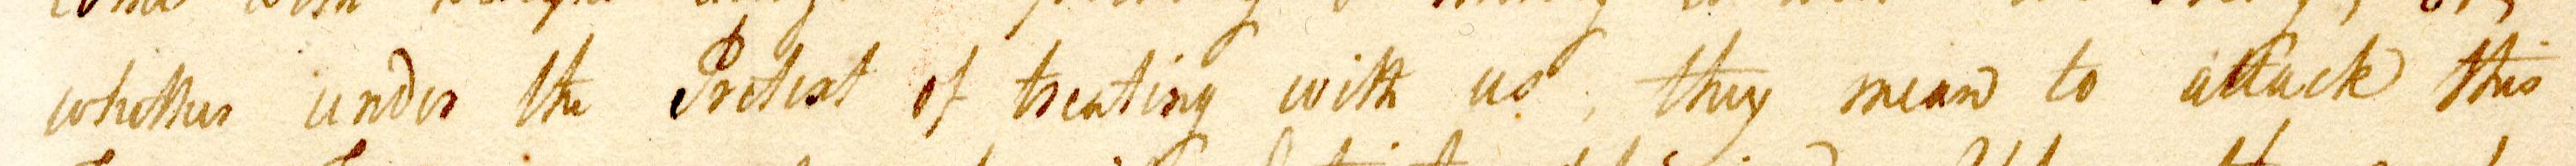whether under the Pretext of treating with us, they mean to attack this
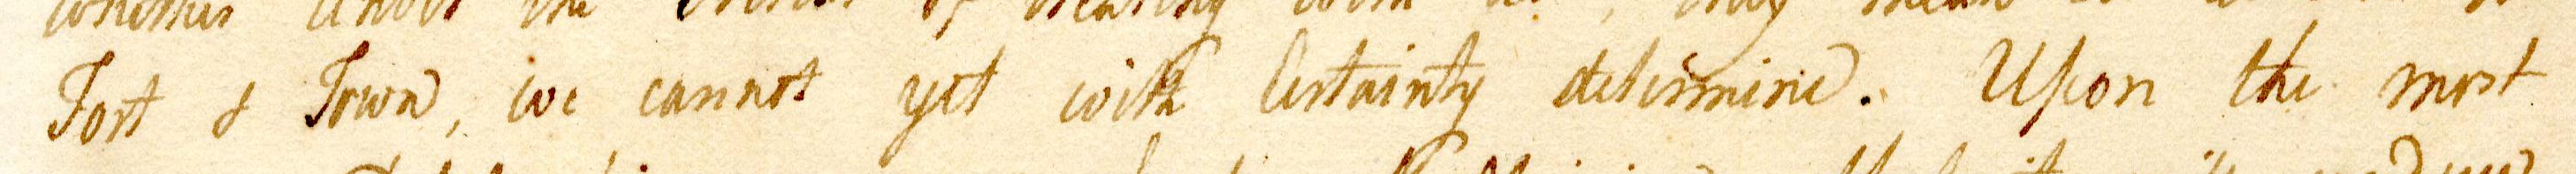Fort & Town, we cannot yet with Certainty determine. Upon the most
